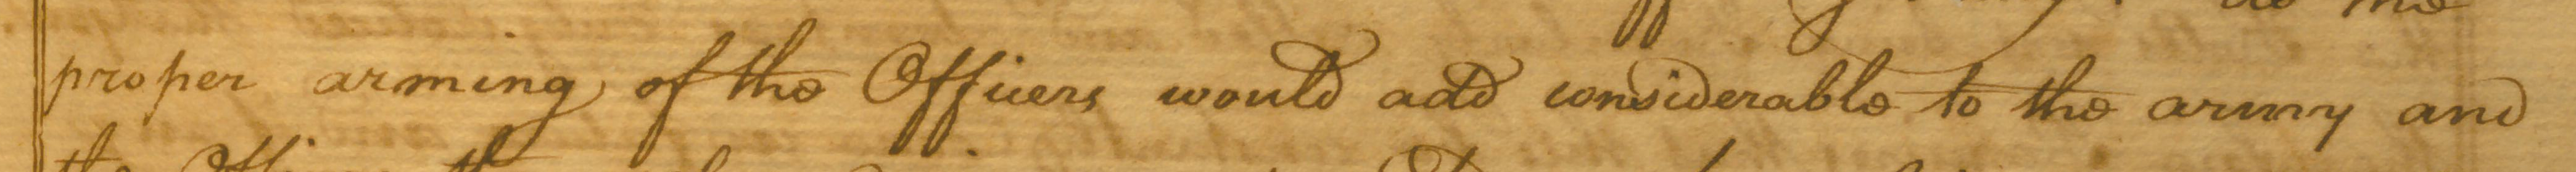proper arming of the Officers would add considerable to the army and
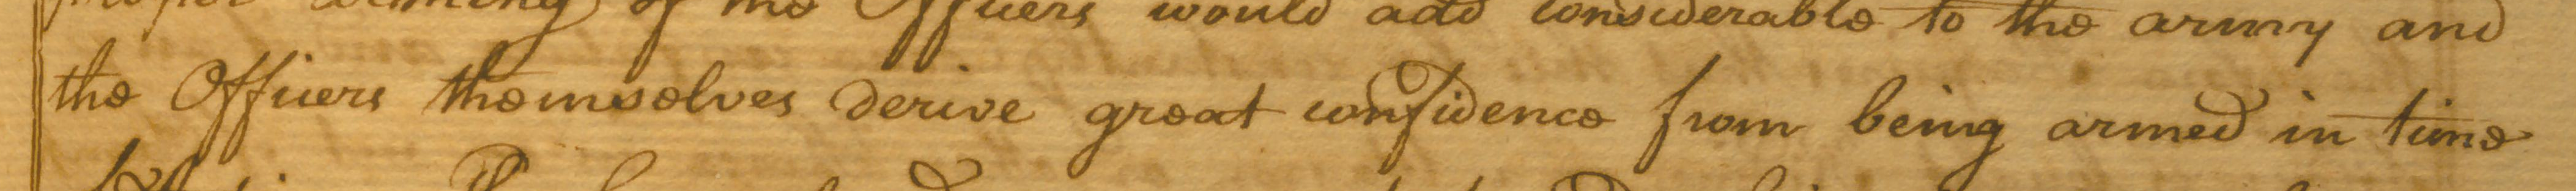the Officers themselves derive great confidence from being armed in time
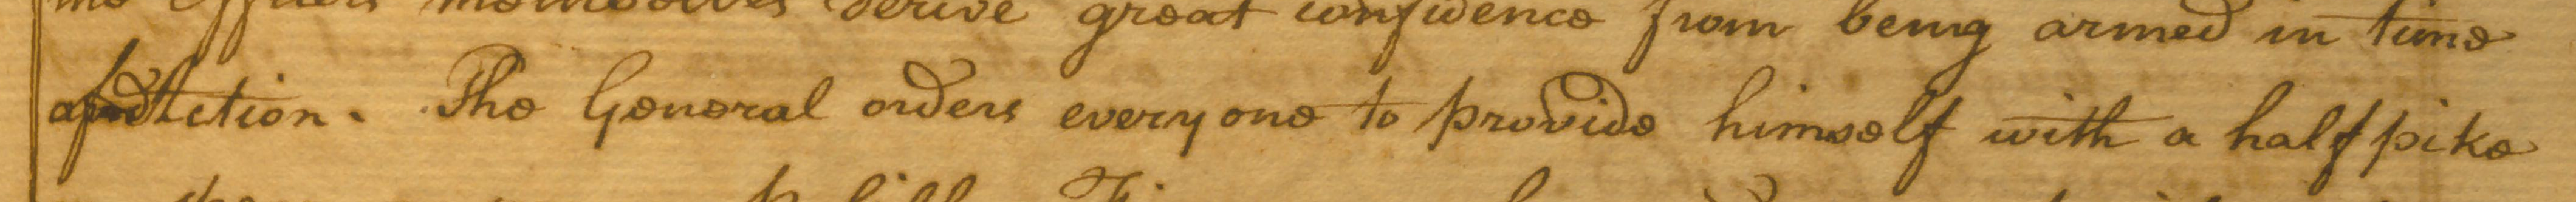of Action. The General orders everyone to provide himself with a half pike
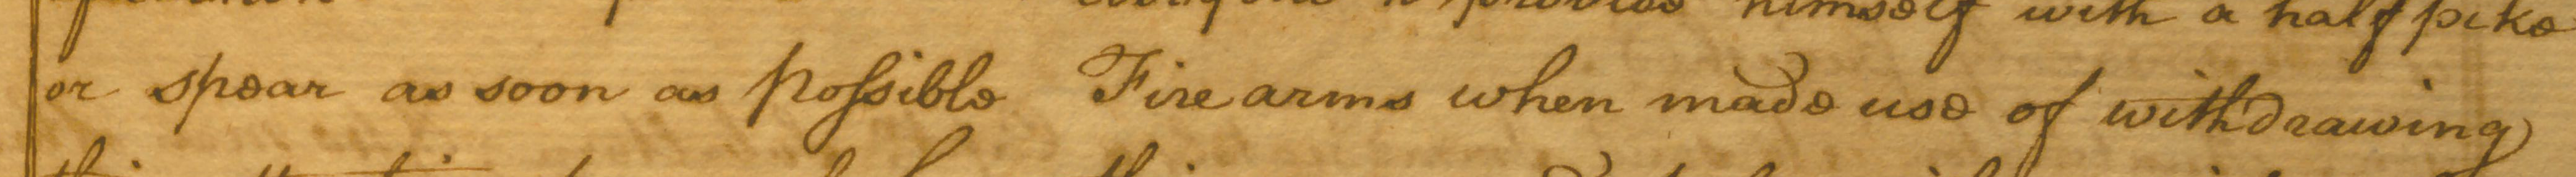or spear as soon as possible. Fire arms when made use of with drawing
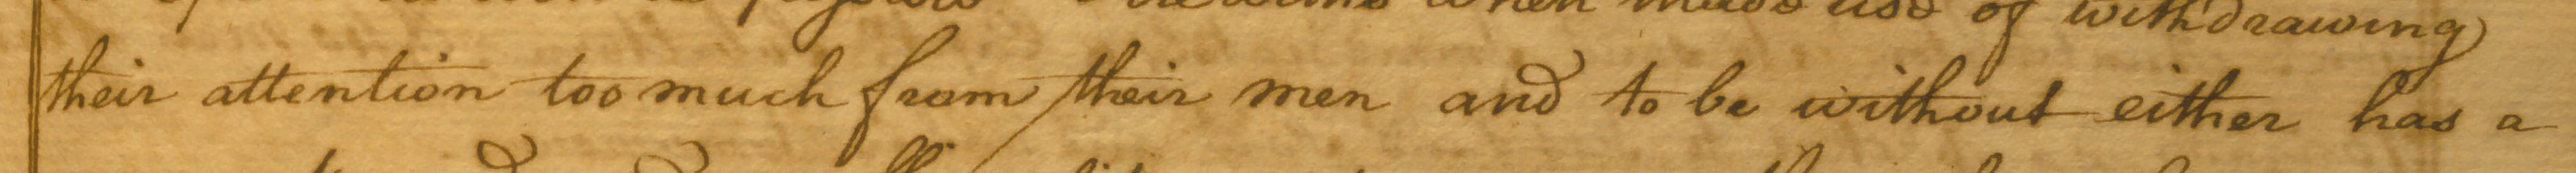their attention too much from their men and to be without either has a
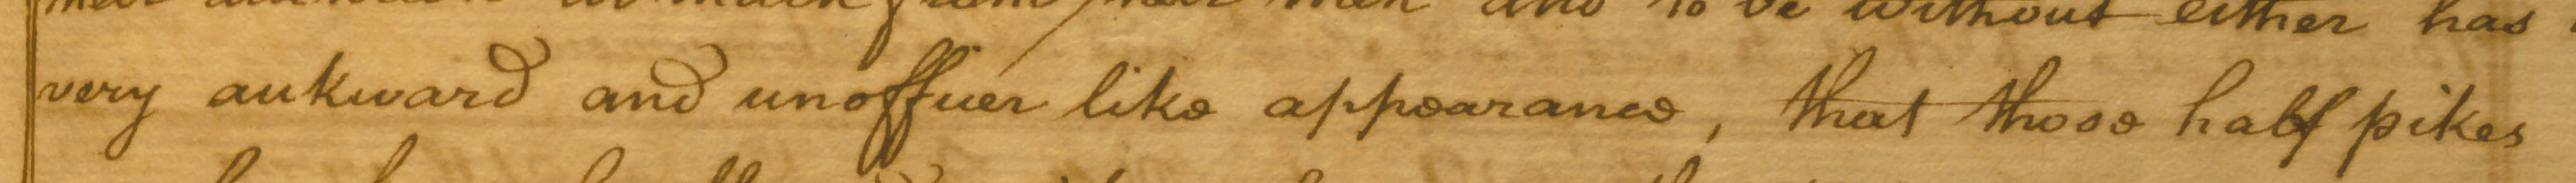very awkward and unofficer like appearance, that those half pikes
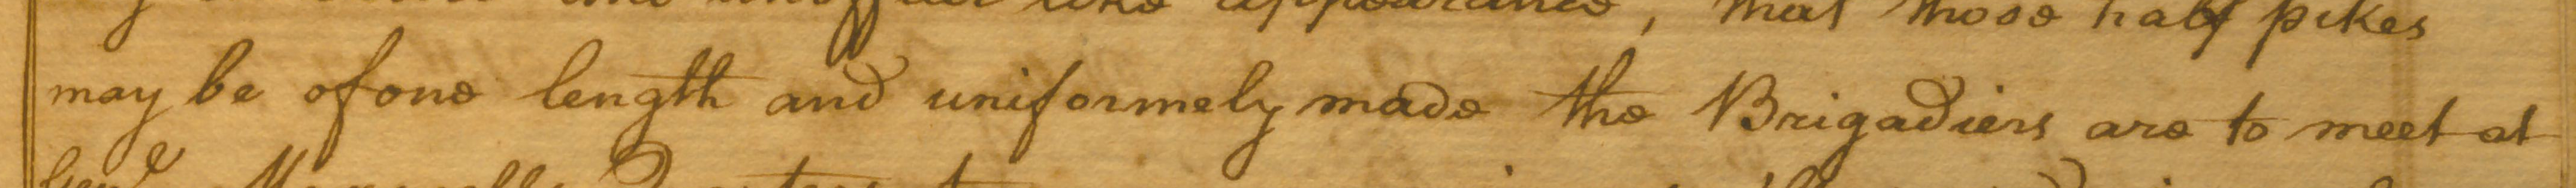may be of one length and uniformly made the Brigadiers are to meet at
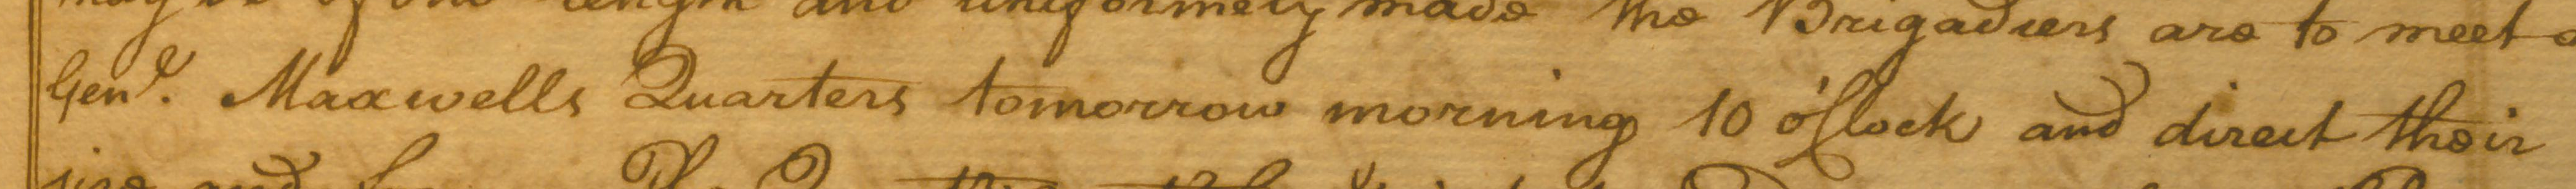Gen^l. Maxwells Quarters tomorrow morning 10 o'Clock and direct their
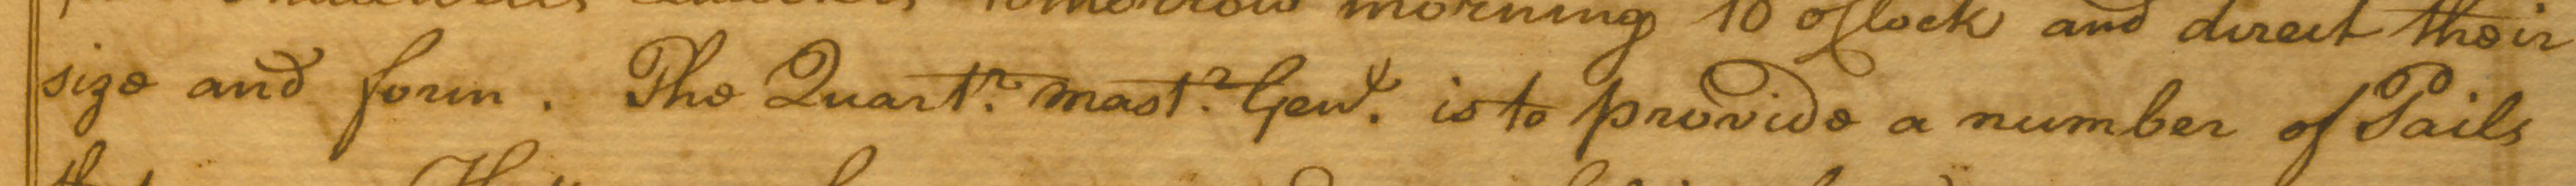size and form. The Quart^r. mast^r. Gen^l. is to provide a number of Pails
